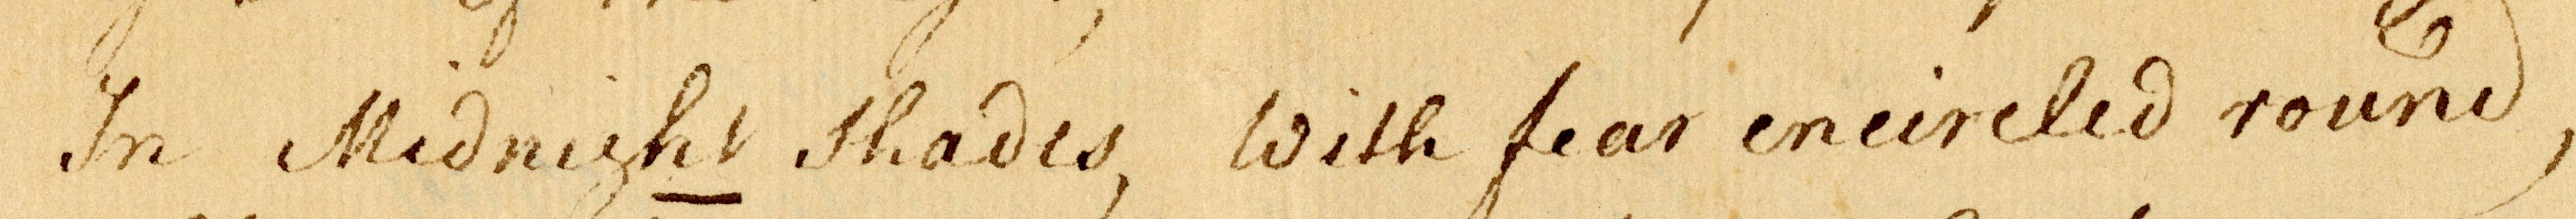In Midnight Shades, With fear encircled round,
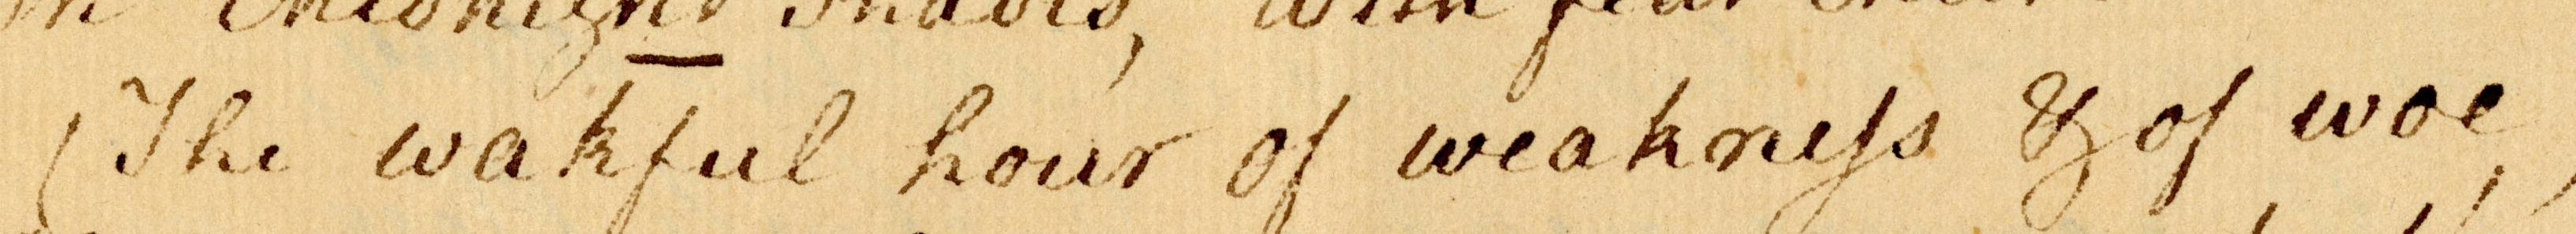The wakful hour of weakness & of woe,
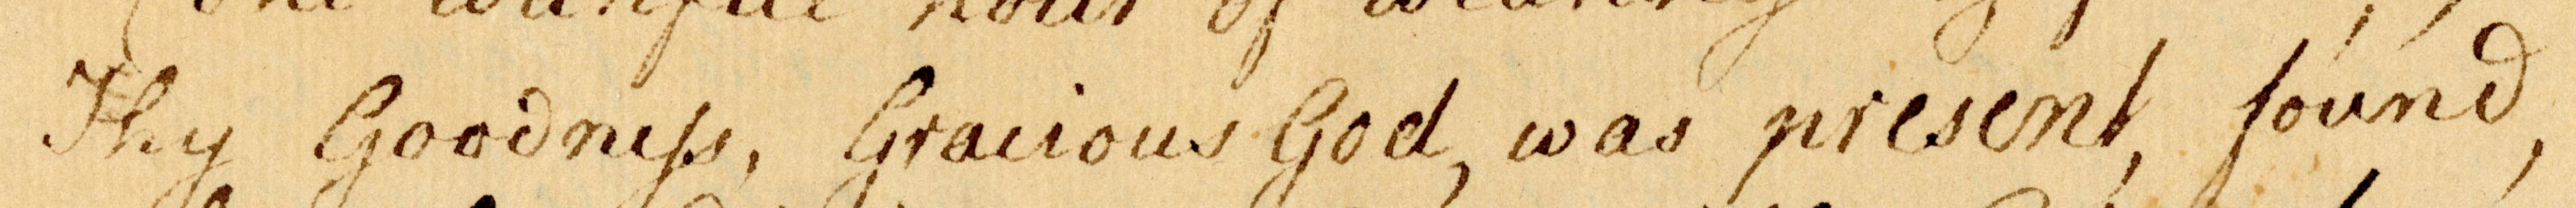Thy Goodness, Gracious God, was present found,
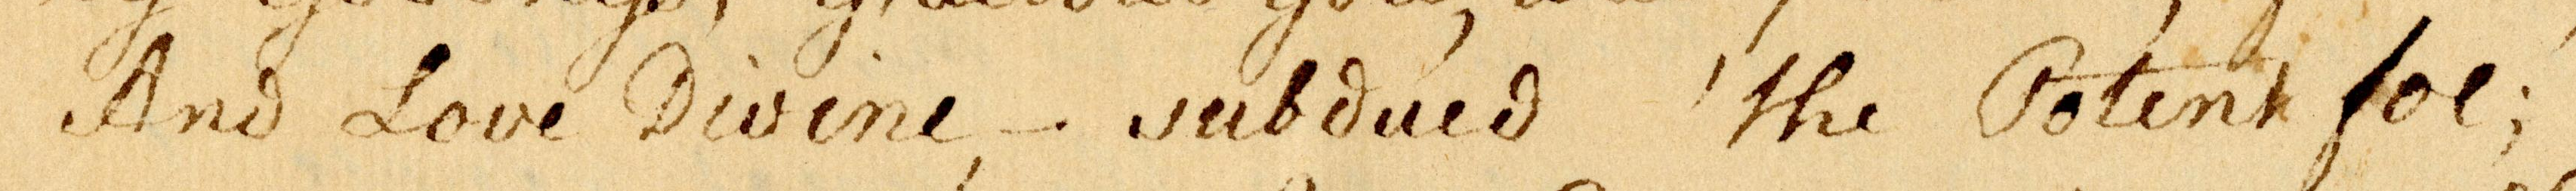And Love Divine- subdued the Potent foe;
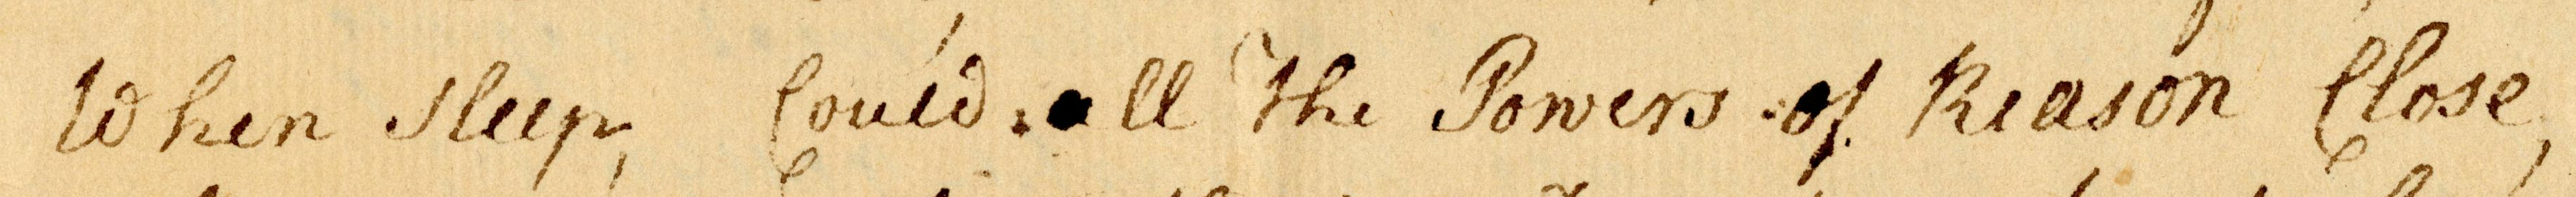W hen sleep, Could all the Powers of Reason Close,
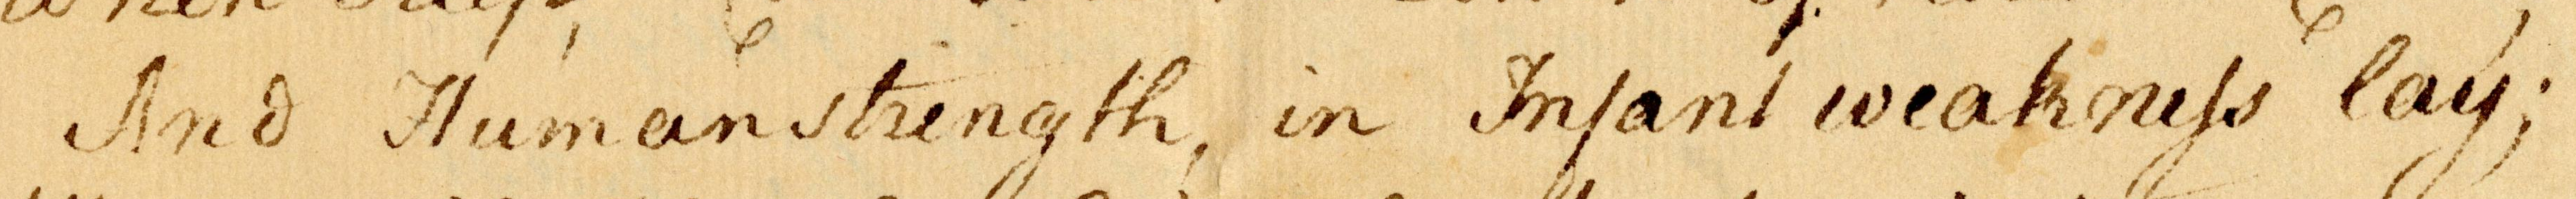And Human strength, in Infant weakness lay;
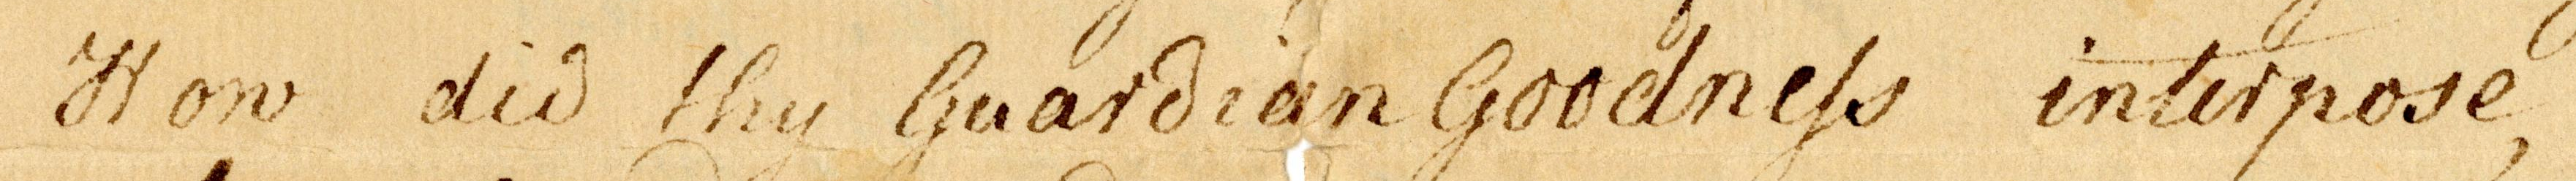How did this Guardian Goodness interpose,
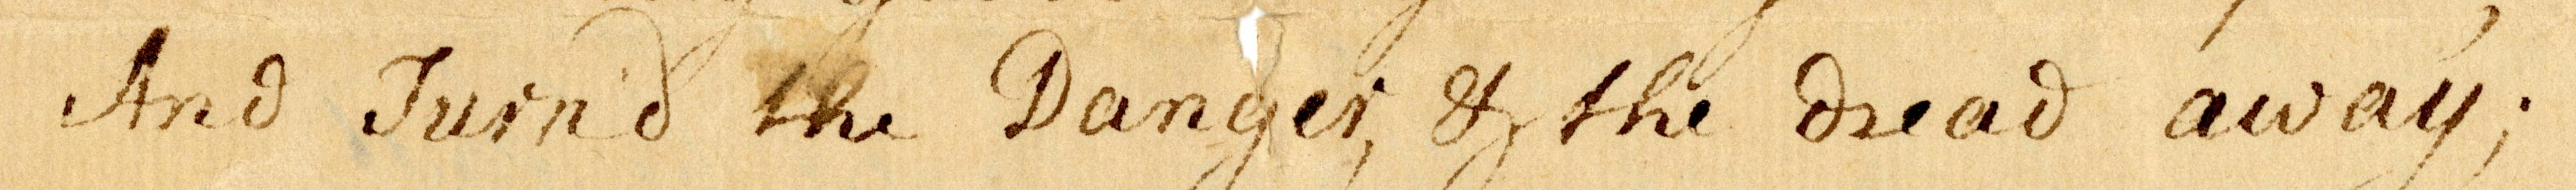And Turn'd the Danger, & the dread away;
